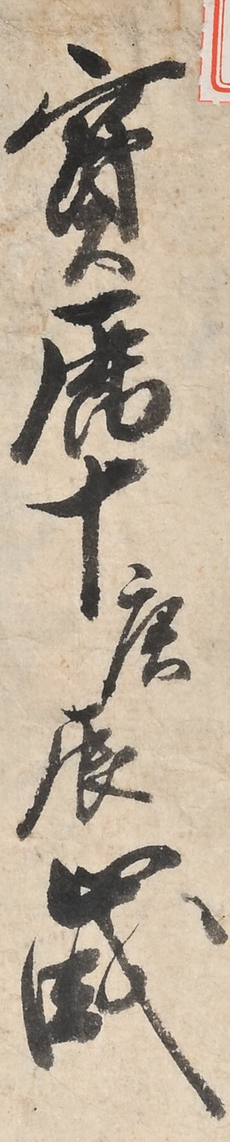宝暦十庚辰歳
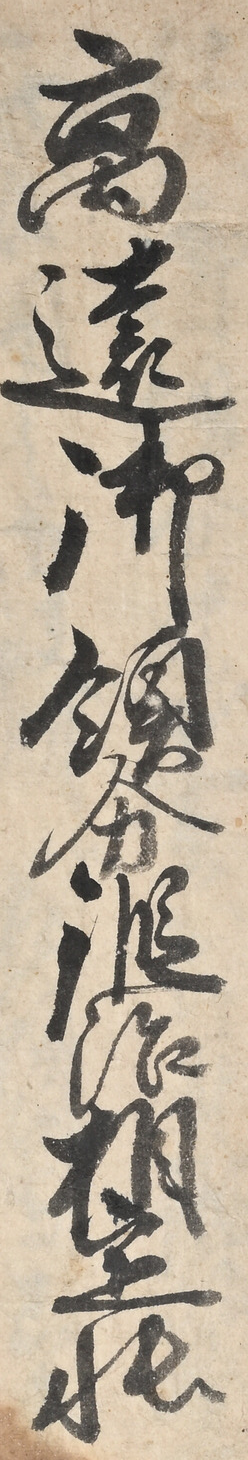高遠御領分鍛冶相定帳
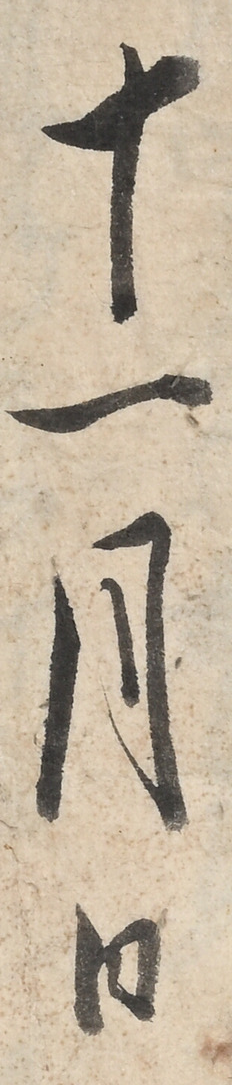十一月日

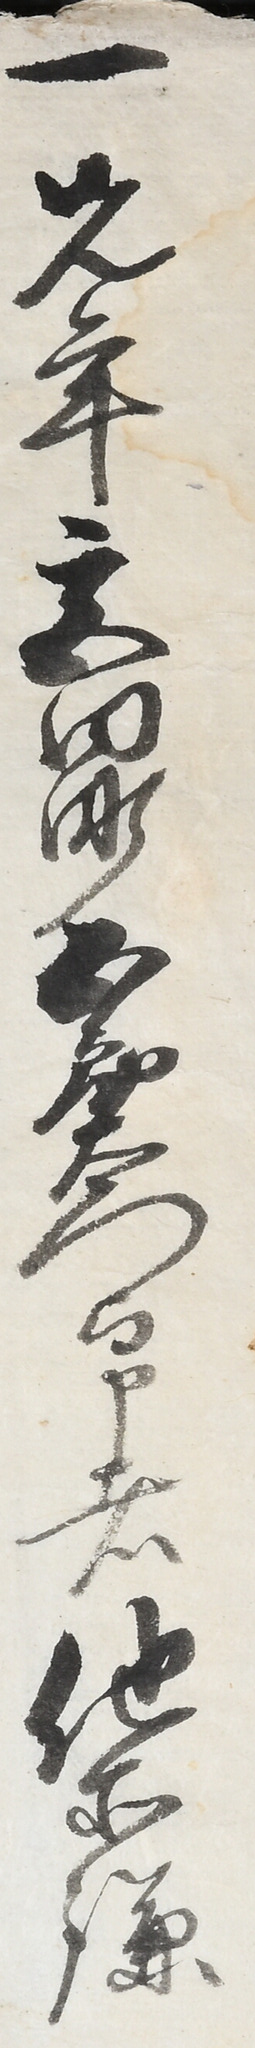一先年宮田町五郎右衛門と申者他所鎌
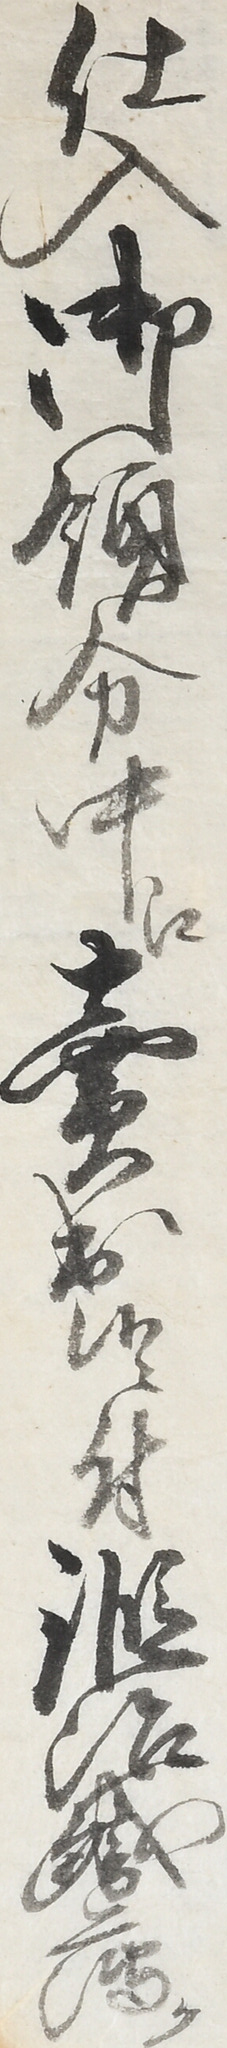仕入御領分中江売出候ニ付鍛冶職薄ク
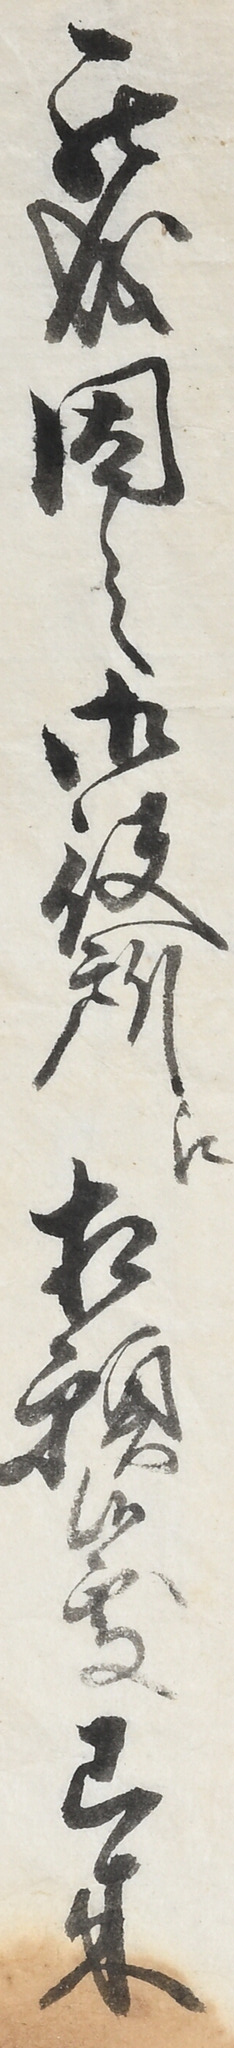被成因之御役所江相願候処已来
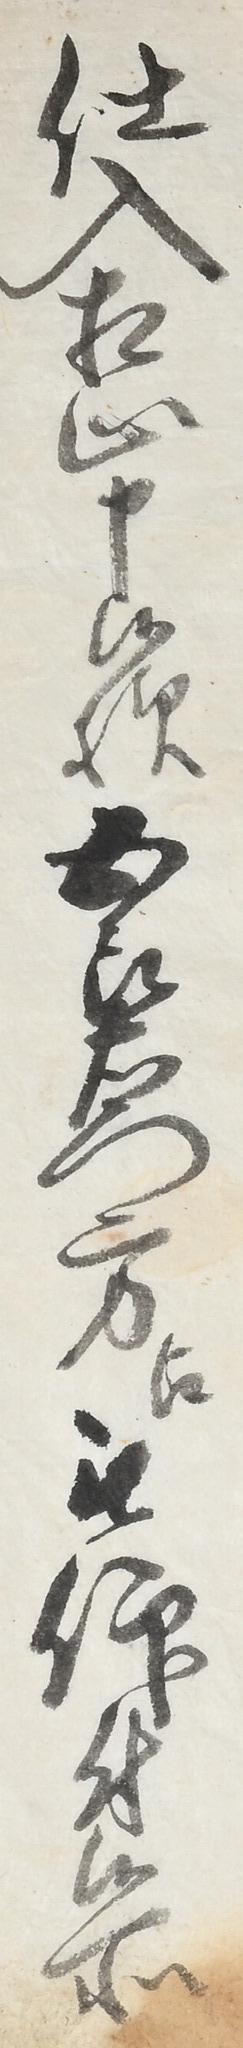仕入相止申候様五左衛門方江被仰付候所
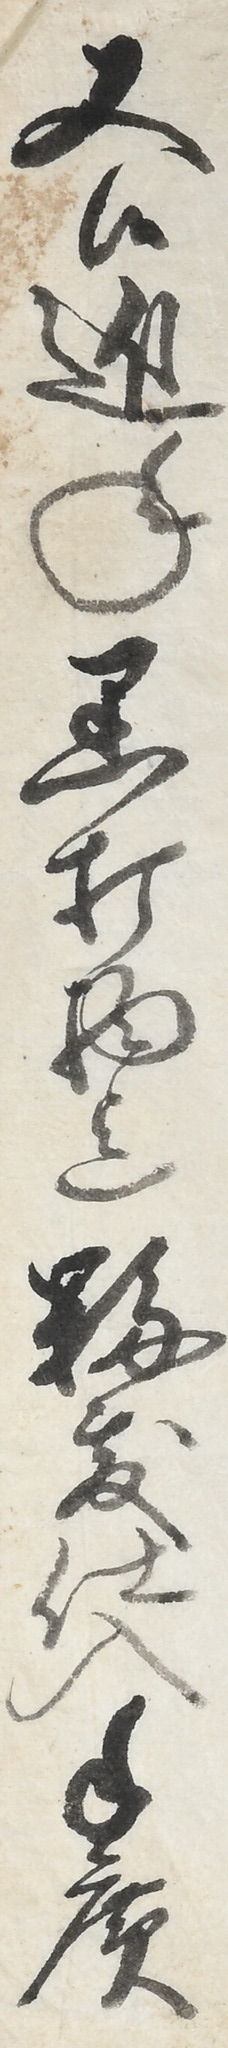又候近年黒打物迄数度仕入手広

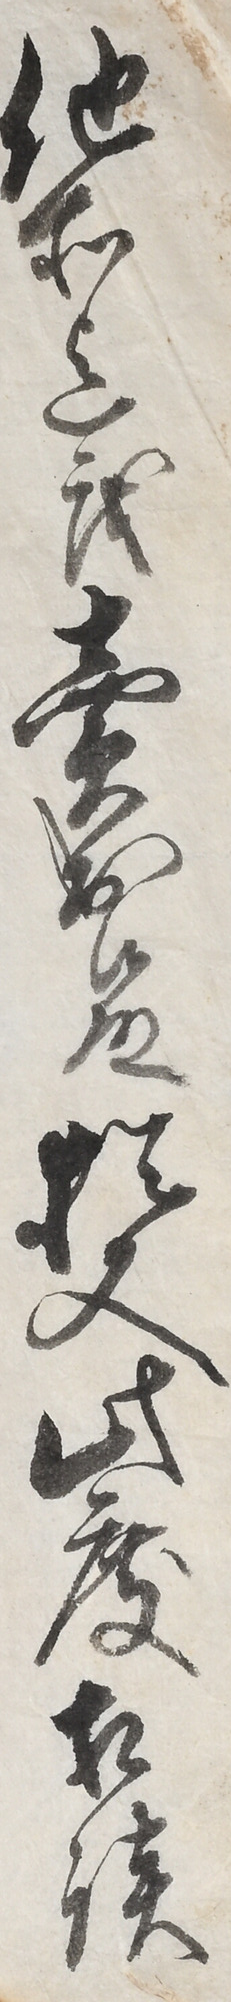他所迄も売出候故猶又此度相談
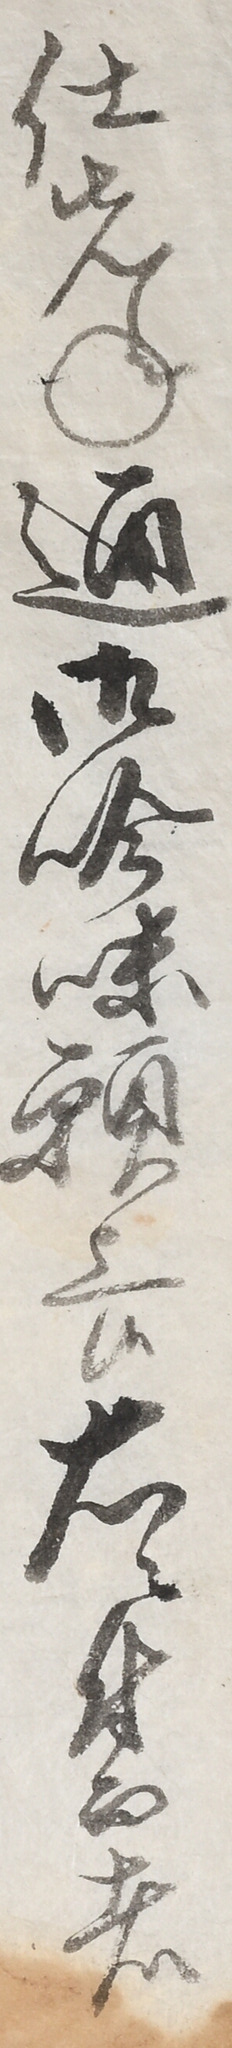仕先年通御吟味願上候右ニ付而者
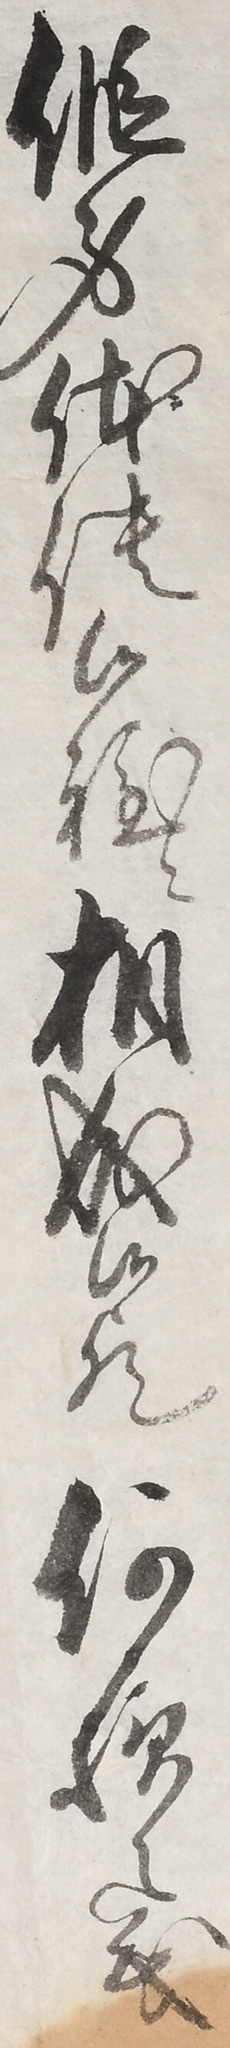縦身体候程ニ相成候欤何様之義
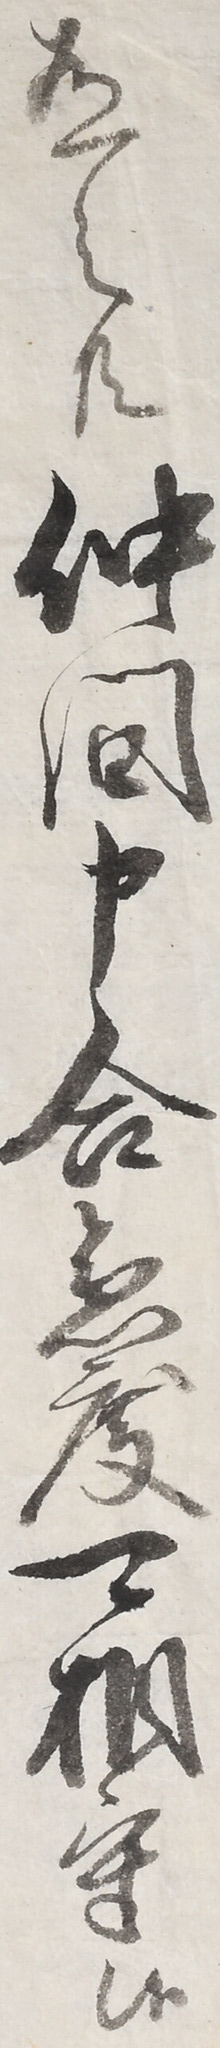有之共仲間申合急度可相守候
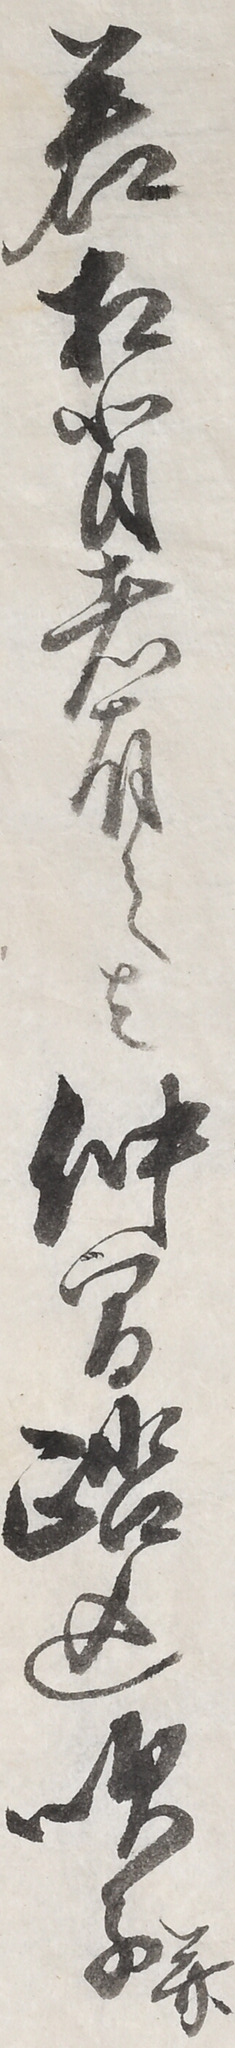若相背者有之は仲間踏込吹子并
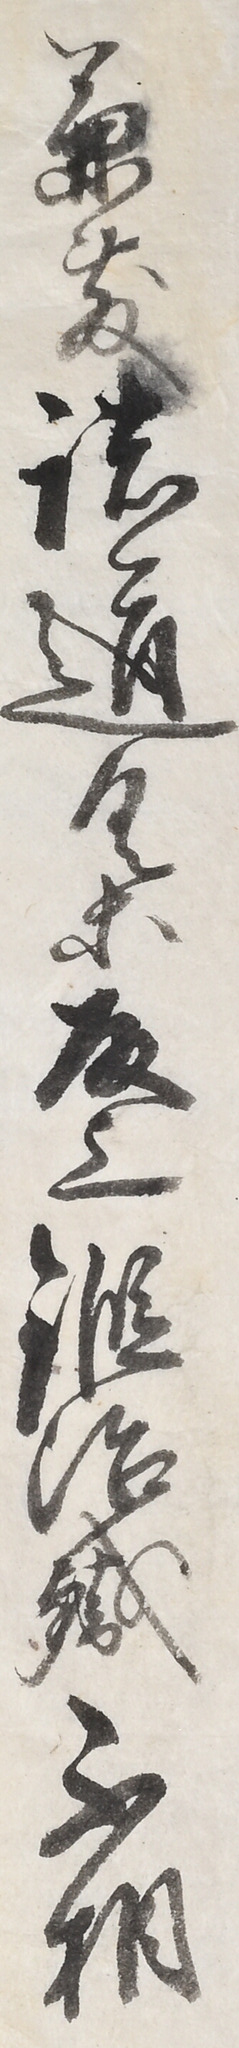兼敷請道具等取上鍛冶職不相
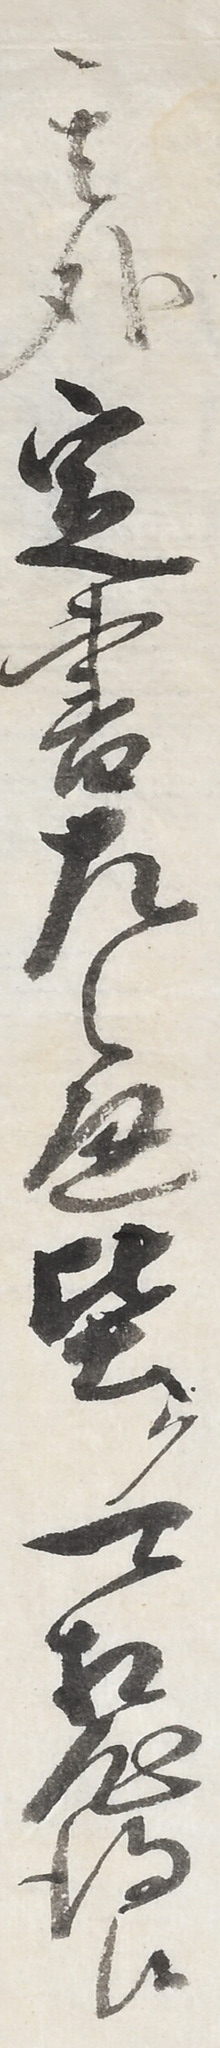其外定書左之通堅ク可相心得候
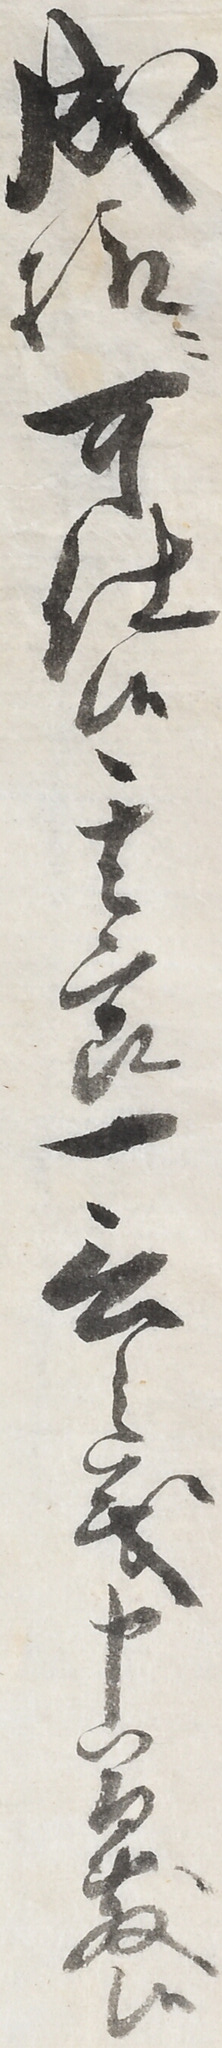成様可仕候其節一言之義申間敷候
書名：高遠御領分鍛冶相定帳
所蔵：伊那市立高遠町図書館・合同会社AMANE
